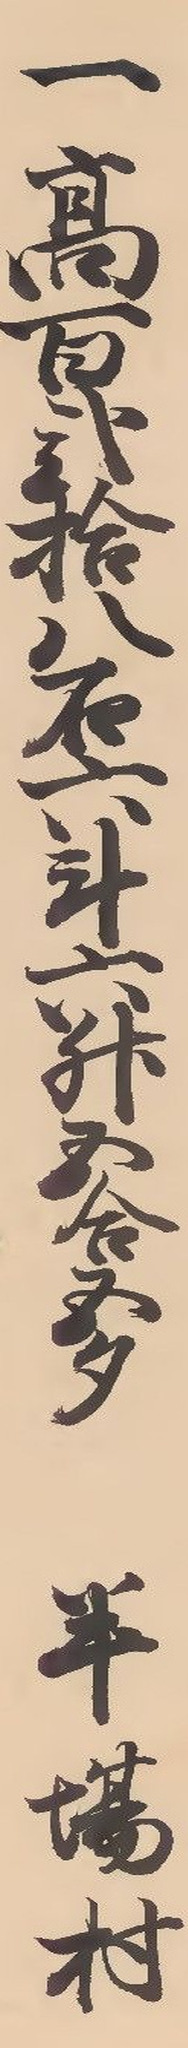一高百弐拾八石六斗六升五合五勺半場村

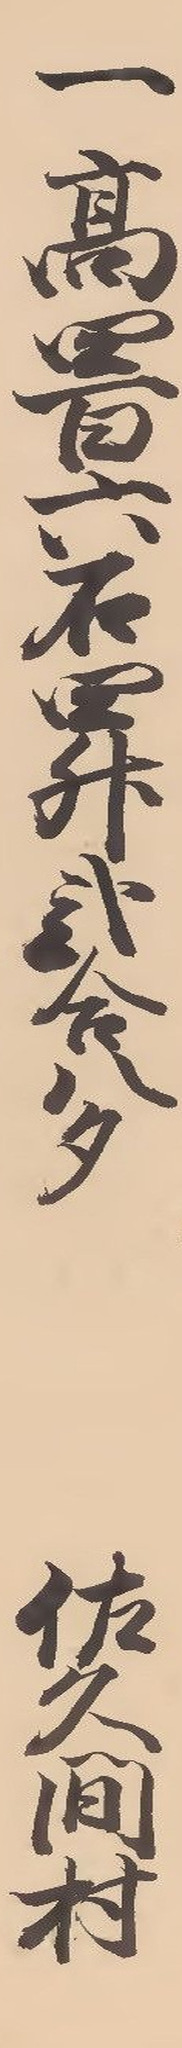一高四百六石四升弐合八勺佐久間村
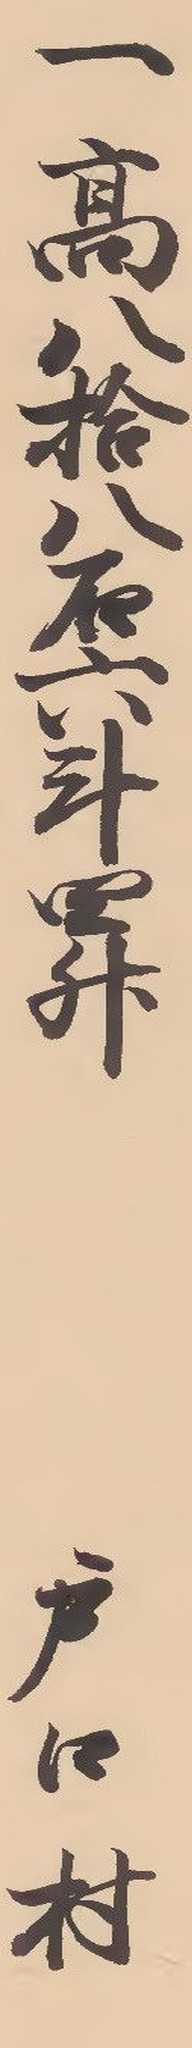一高八拾八石六斗四升戸口村
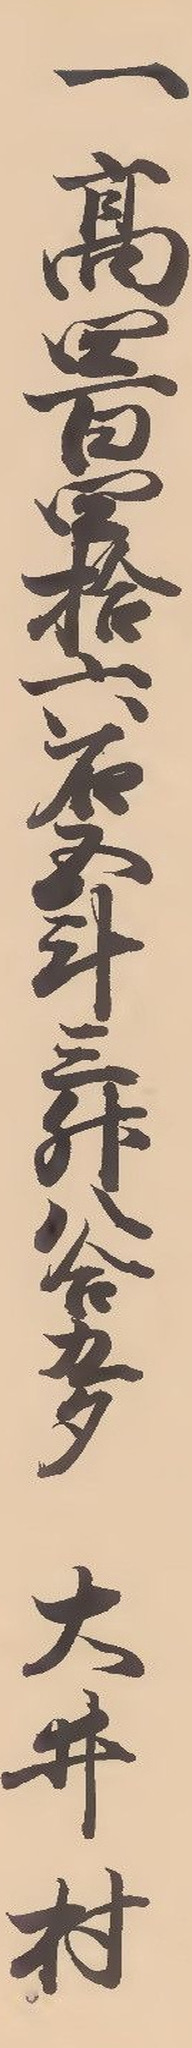一高四百四拾六石五斗三升八合五勺大井村
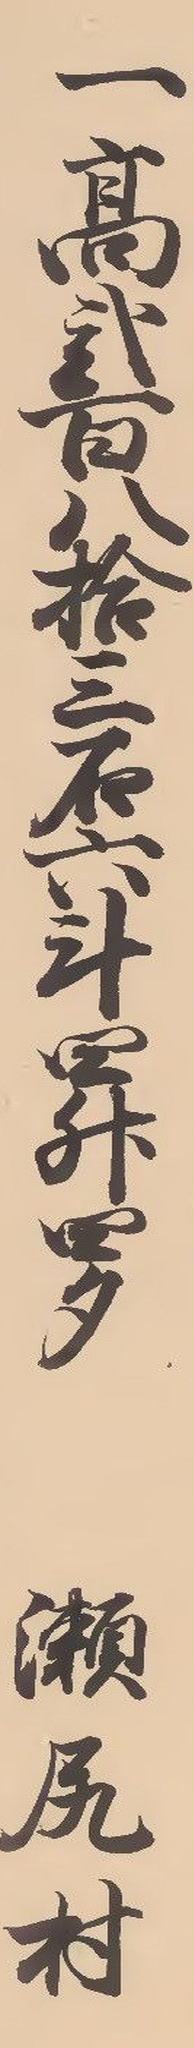一高弐百八拾三石六斗四升四勺瀬尻村
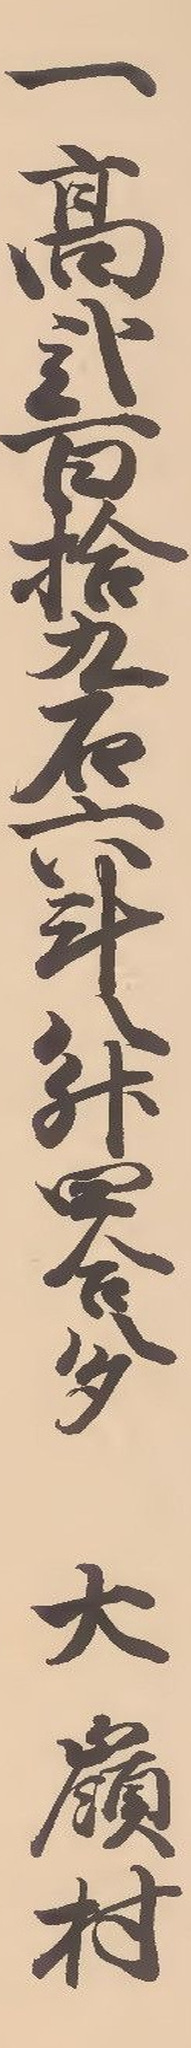一高弐百拾九石六斗八升四合八勺大嶺村
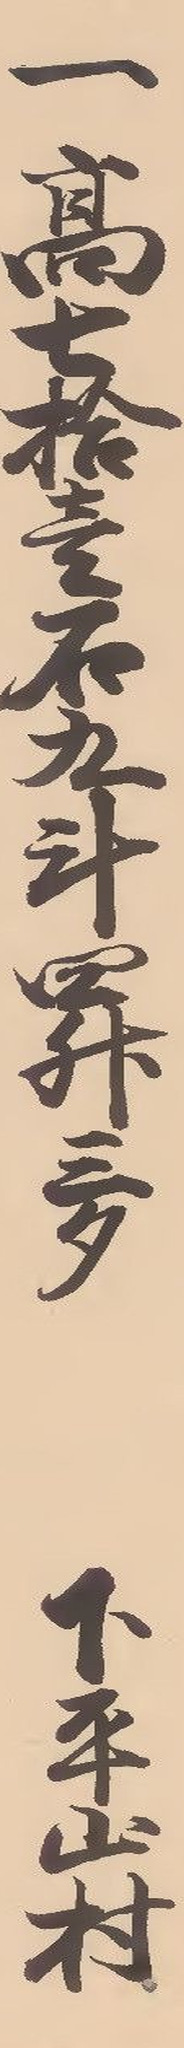一高七拾壱石九斗四升三勺下平山村
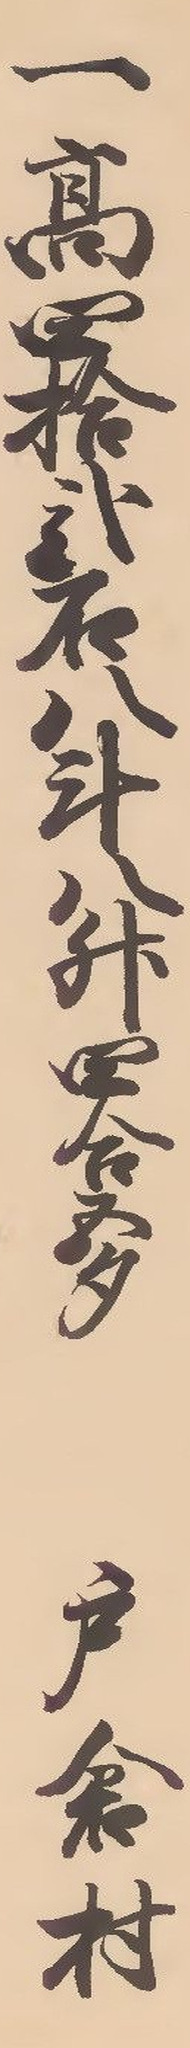一高四拾弐石八斗八升四合五勺戸倉村

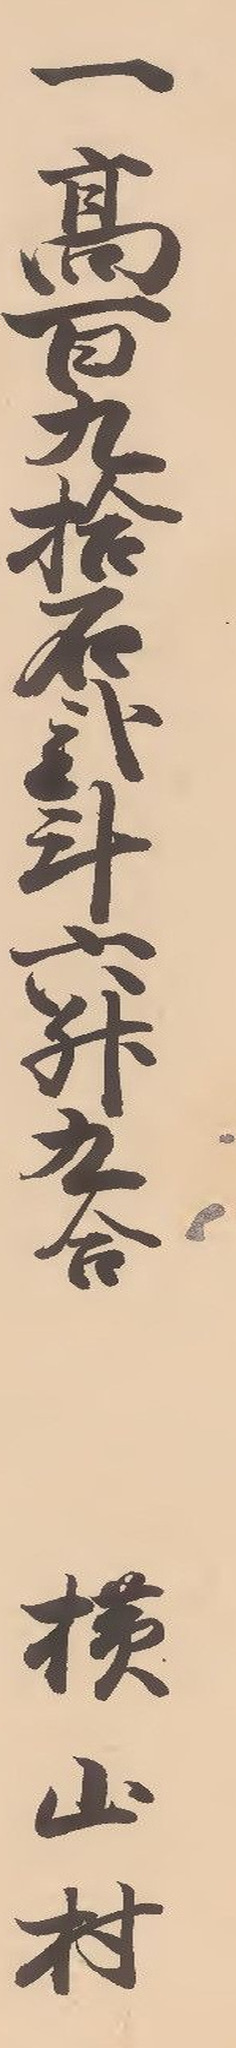一高百九拾石弐斗六升九合横山村
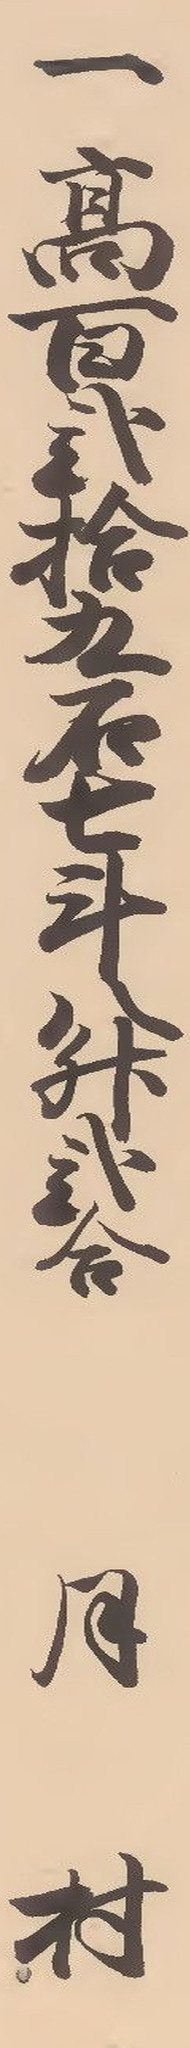一高百弐拾九石七斗八升弐合月村
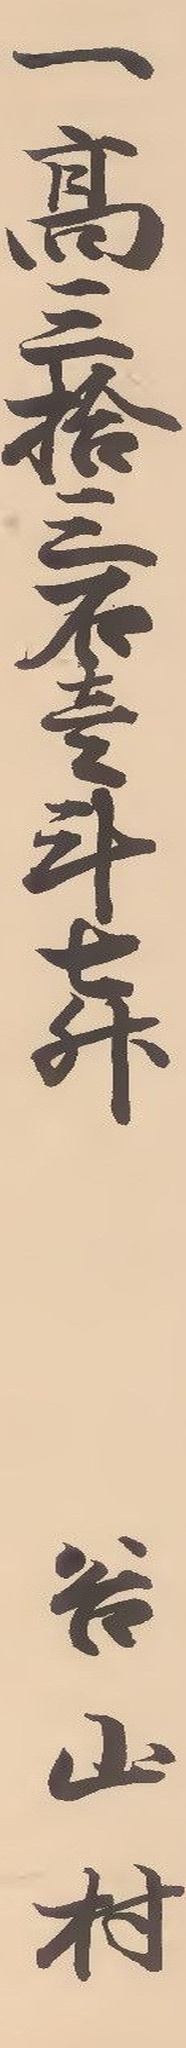一高三拾三石壱斗七升谷山村
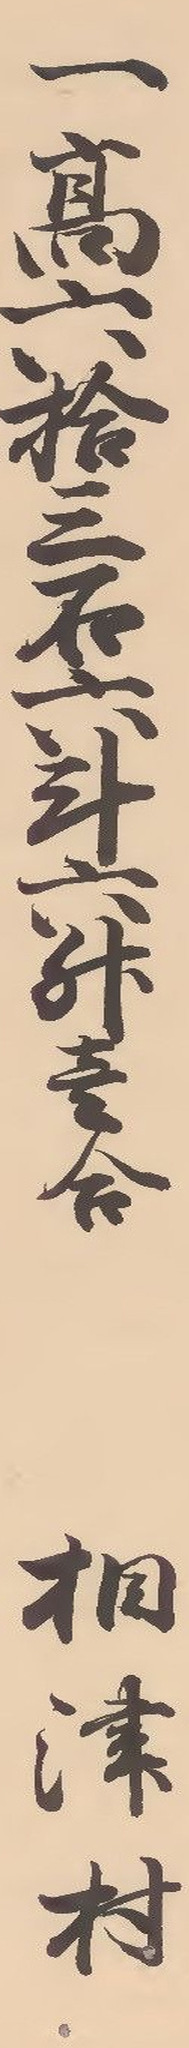一高六拾三石六斗六升壱合相津村
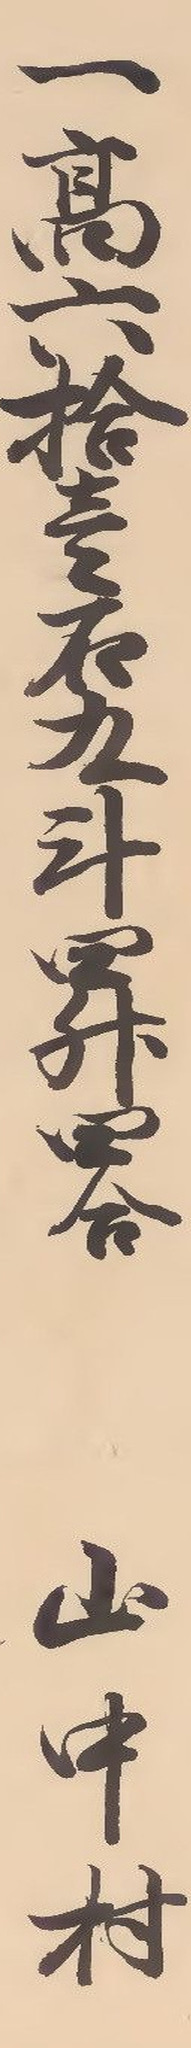一高六拾壱石九斗四升四合山中村
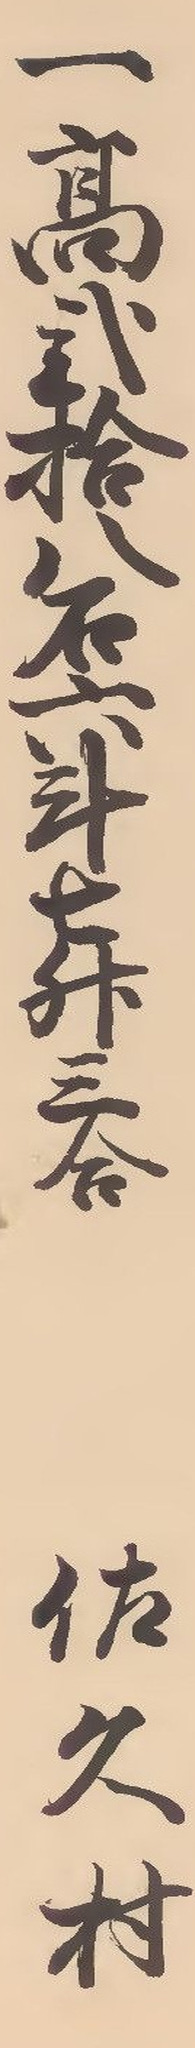一高弐拾八石六斗七升三合佐久村

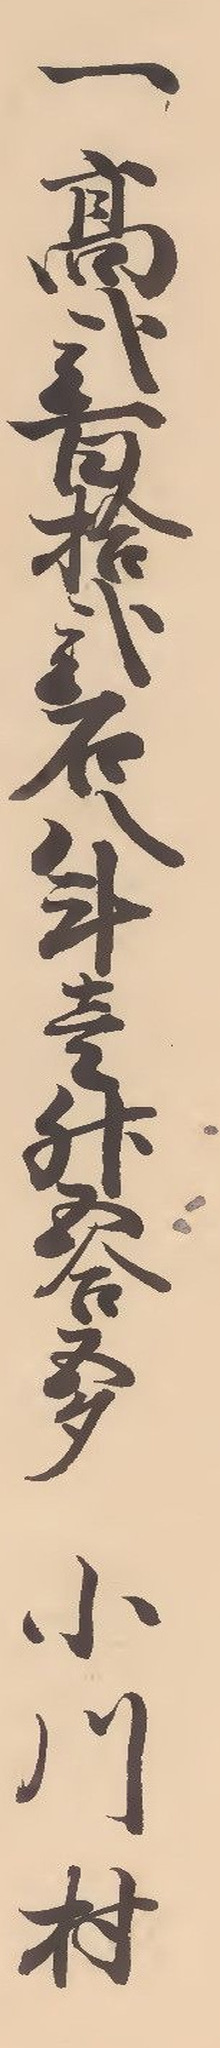一高弐百拾弐石八斗壱升五合五勺小川村
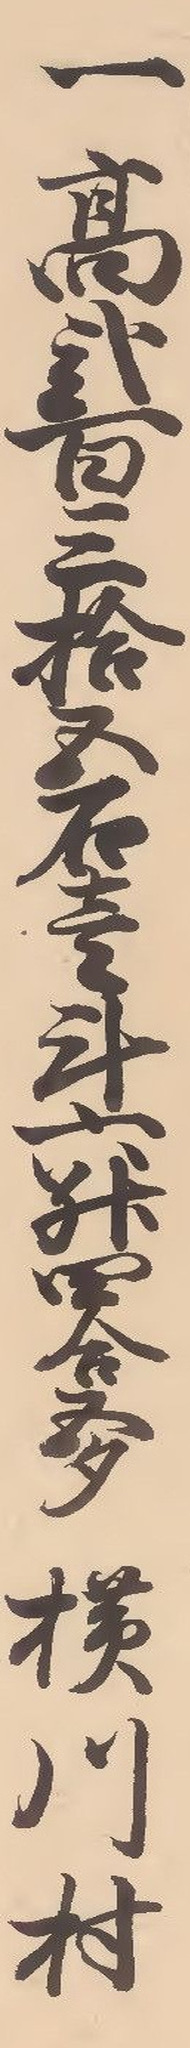一高弐百三拾五石壱斗六升四合五勺横川村
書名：遠江国郷帳
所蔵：国立公文書館 National Archives of Japan
